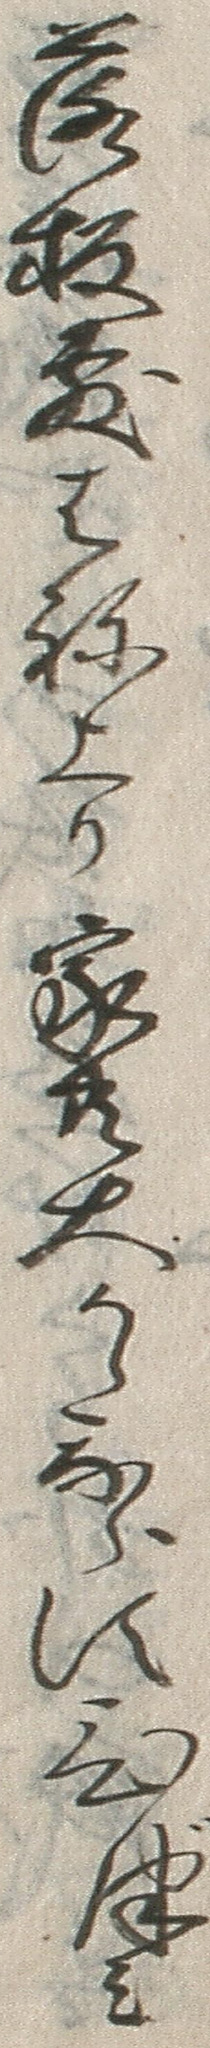落板敷はね上り家共大かたならすひづみ
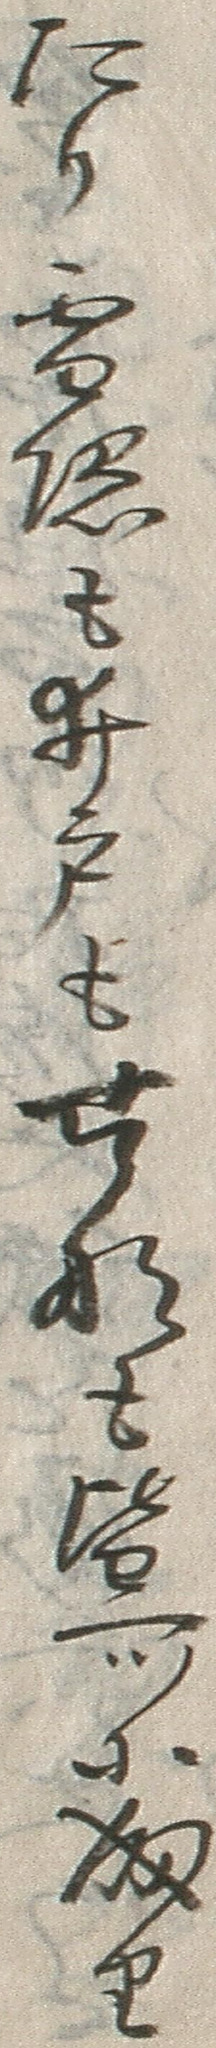たり雪隠も井戸もせなも皆一ツに成り
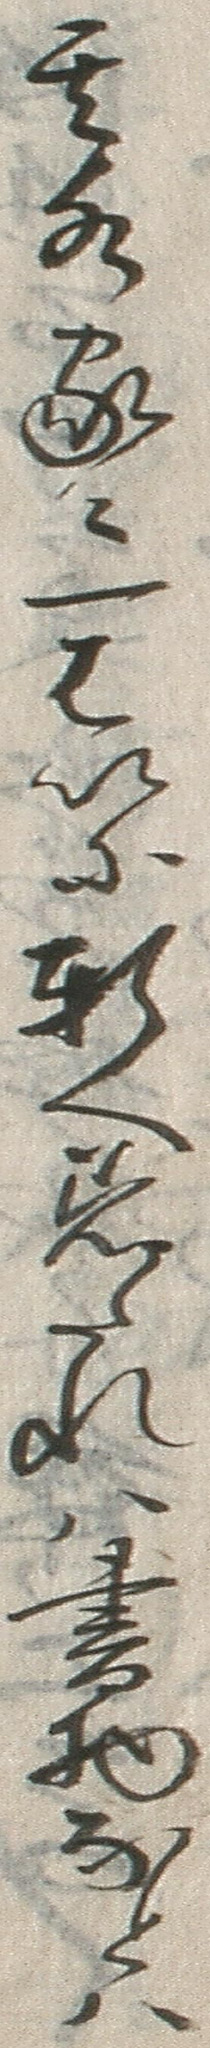其水家に一はいに軒へ着たれは書物なとは
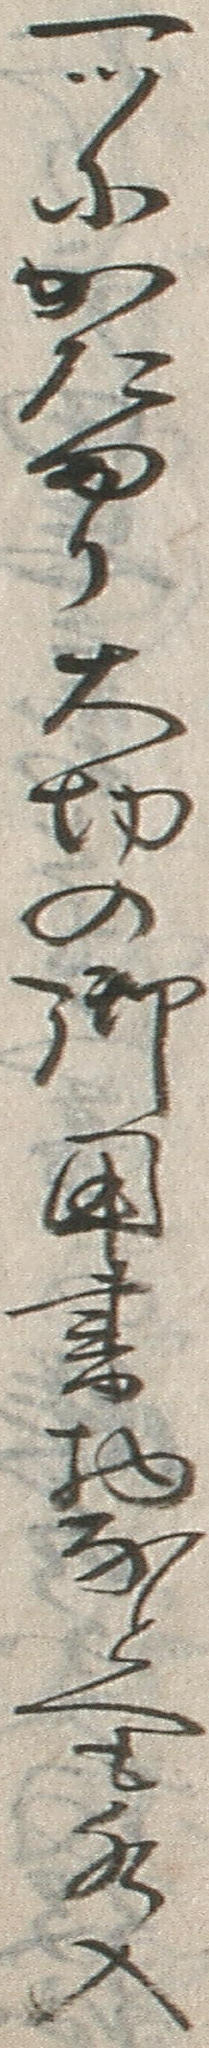一ツにかたまり大切の御用書物なとへも水入

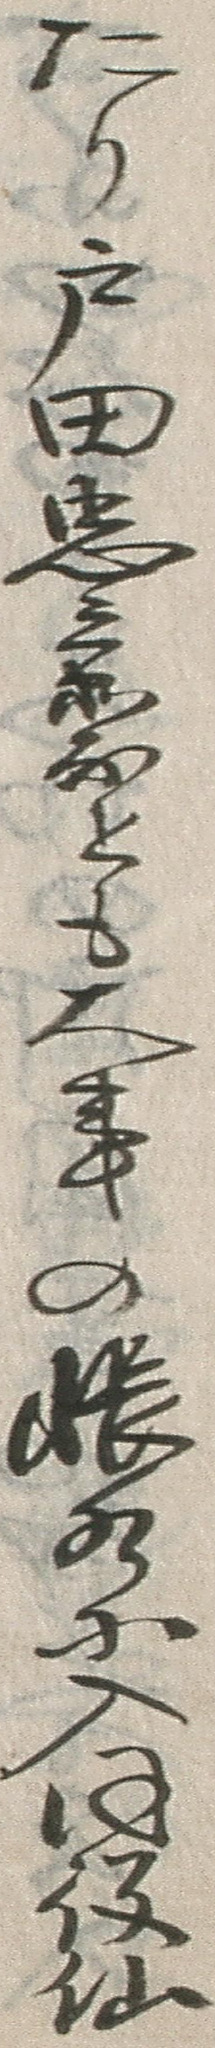たり戸田忠兵衛なとも大事の帳水に入同役仙
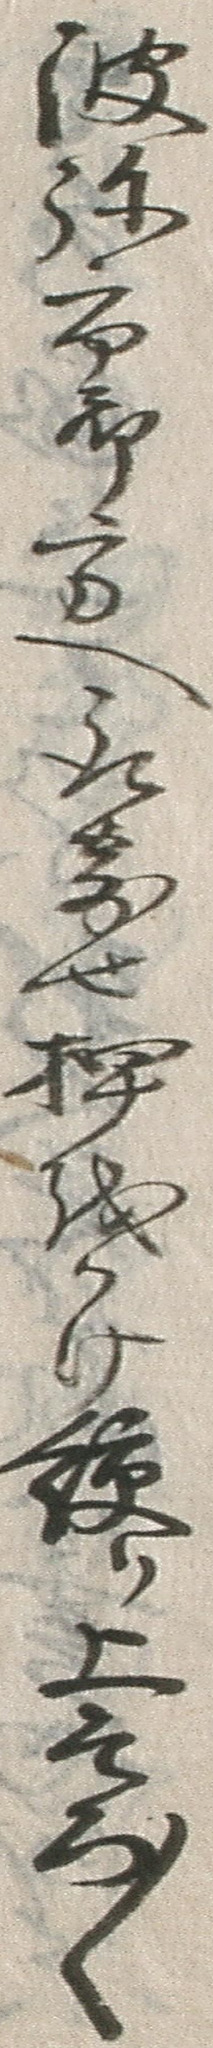波弥市郎方へ取寄せ押をかけ絞り上そろ〳〵
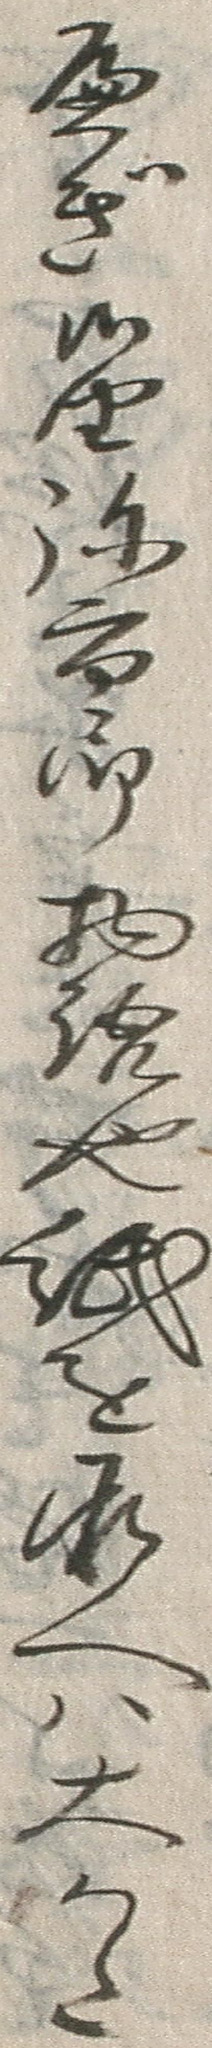へぎ候由弥市郎物語也紙を承へは大かた
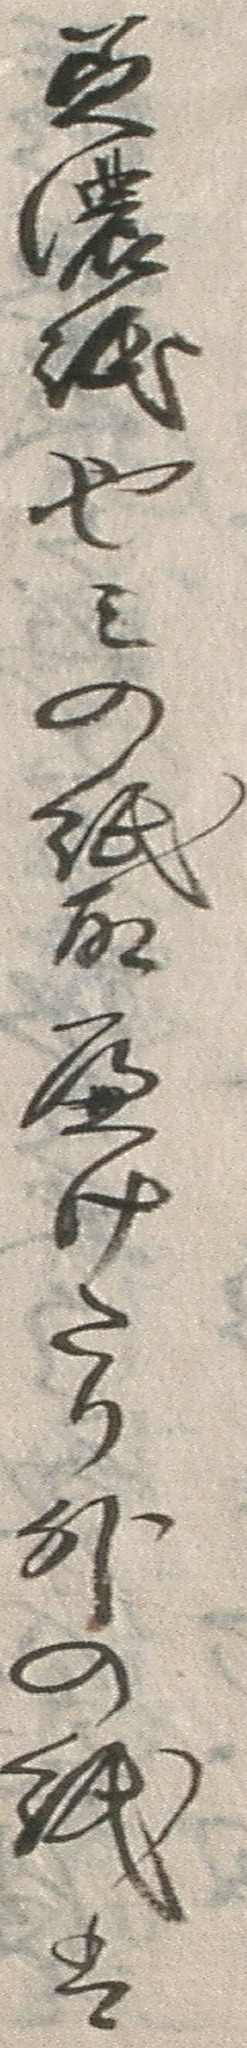美濃紙也みの紙故へけたり外の紙は
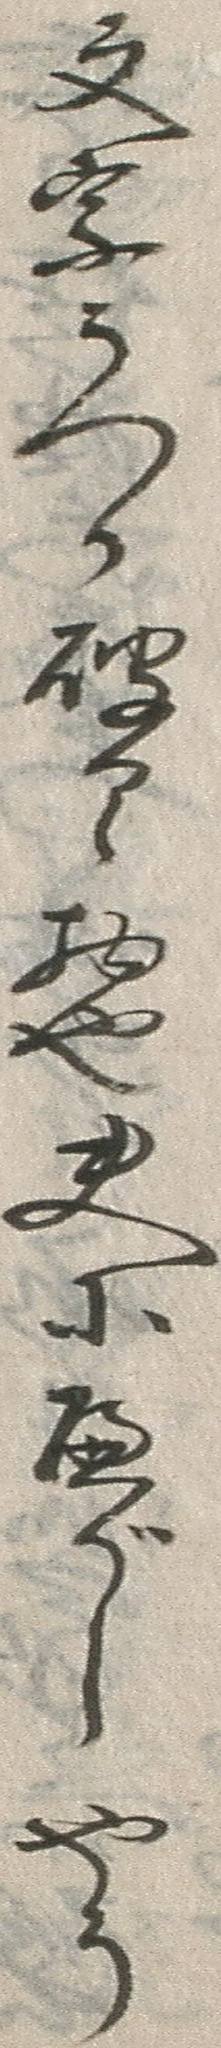文字うつり破るゝ物也夫にへがしやう
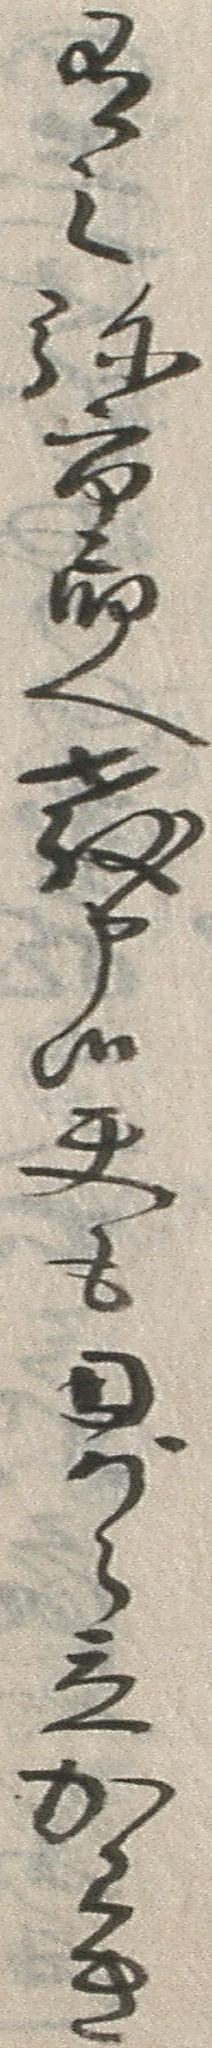有之弥市郎へ教申候夫も日がら立かわき
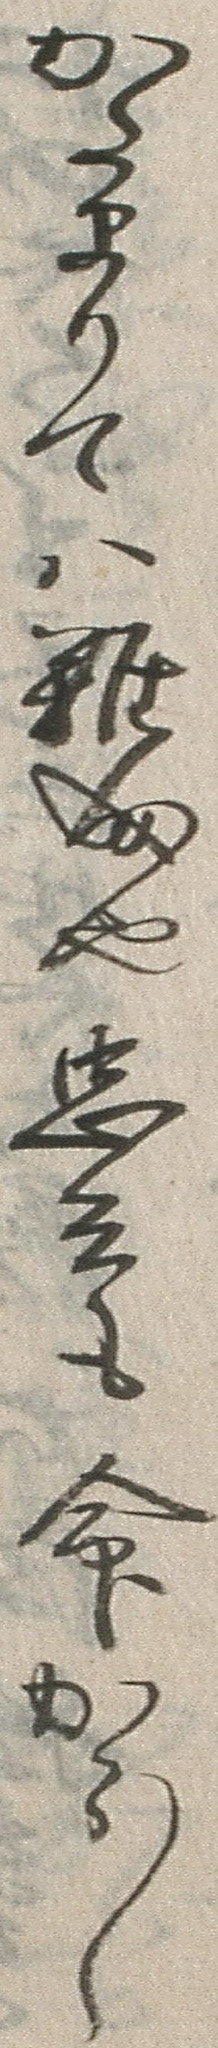かたまりては難成也忠兵も命から〳〵
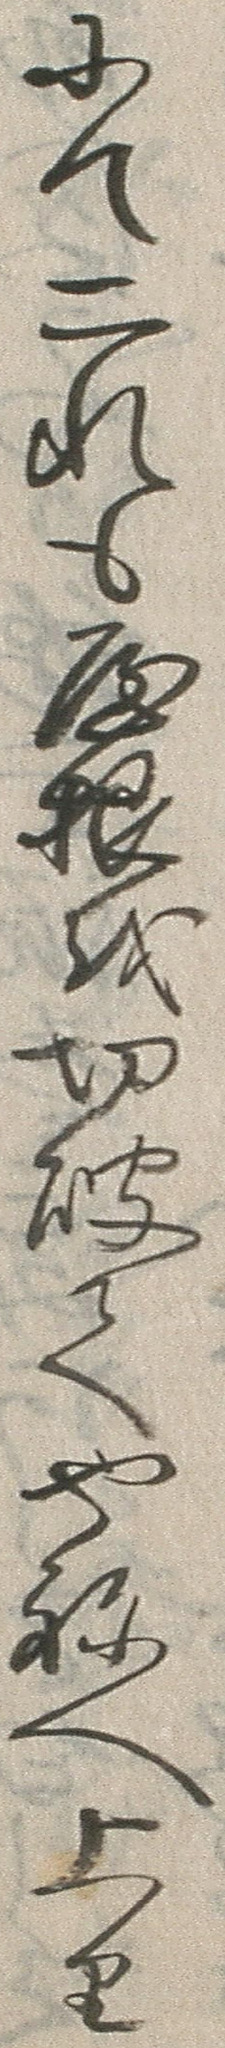にてこれも屋根を切破りてやねへ上り
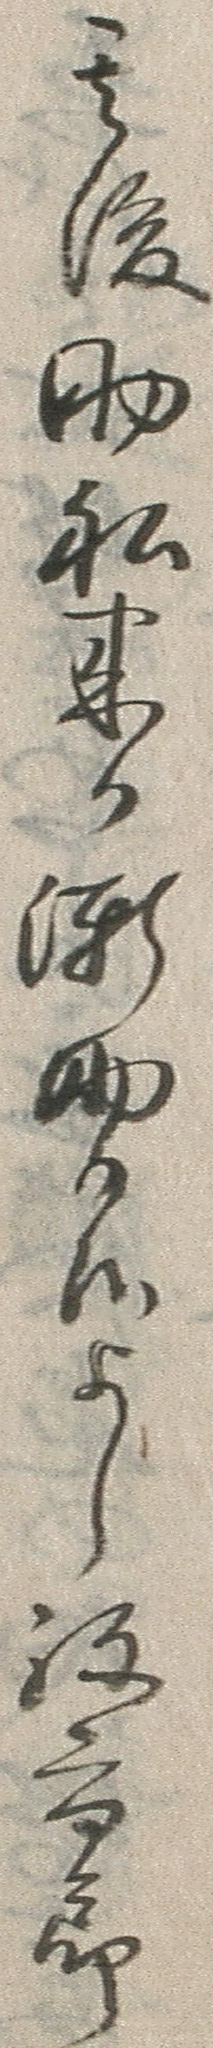其後助舟来り漸助り候よし弥市郎
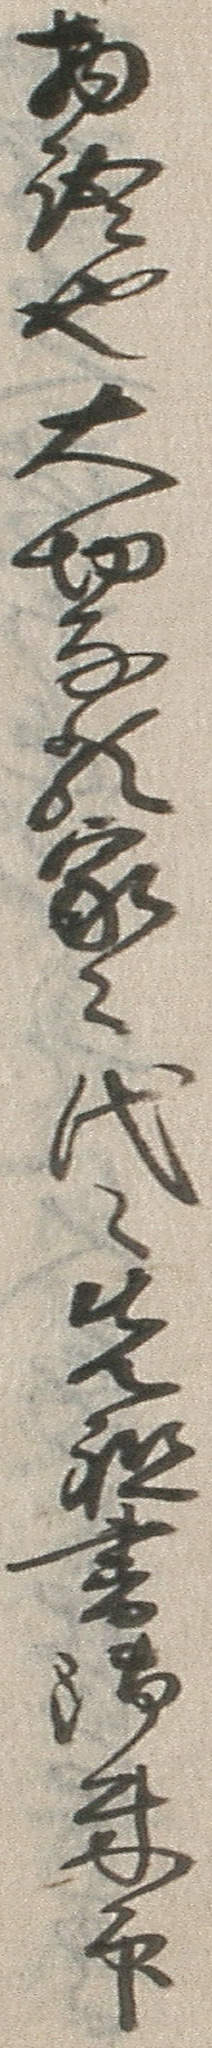物語也大切なる家々代々先祖書御朱印
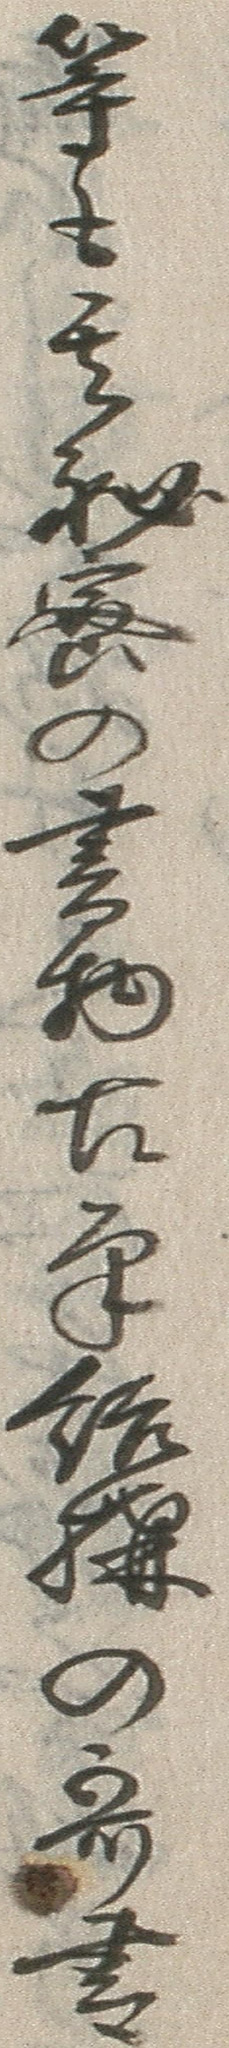等も其秘密の書物古筆結構の哥書
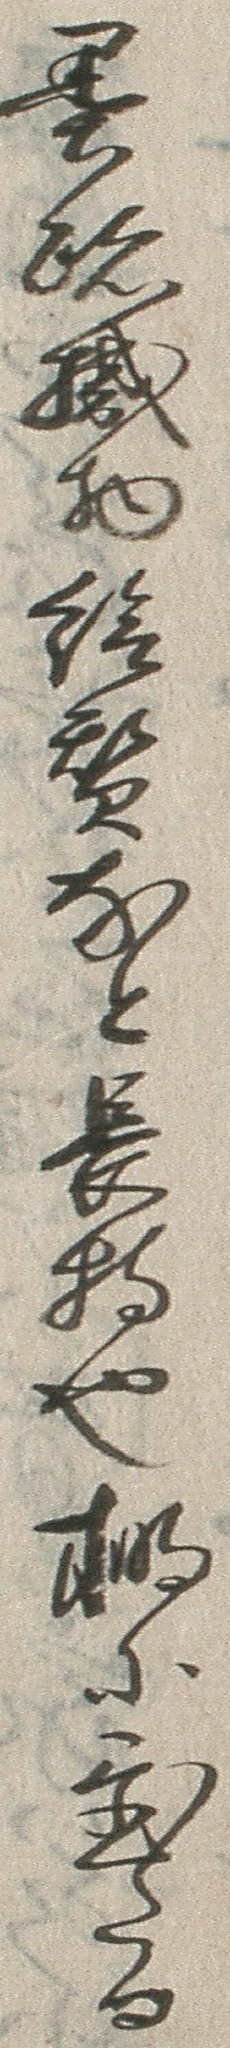書跡掛物絵賛なと長持也棚に置たる
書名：享保十三年江戸洪水記
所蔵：東京大学地震研究所図書室 Earthquake Research Institute Library, The University of Tokyo, JAPAN
